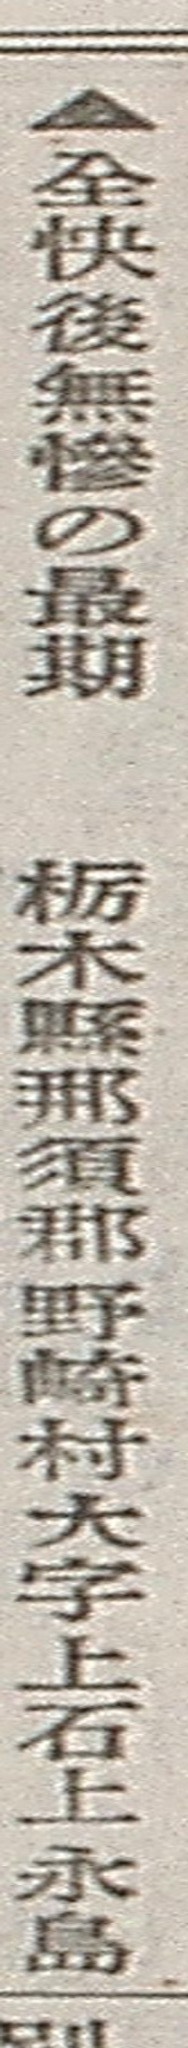▲全快後無惨の最期栃木県那須郡野崎村大字上石上永島
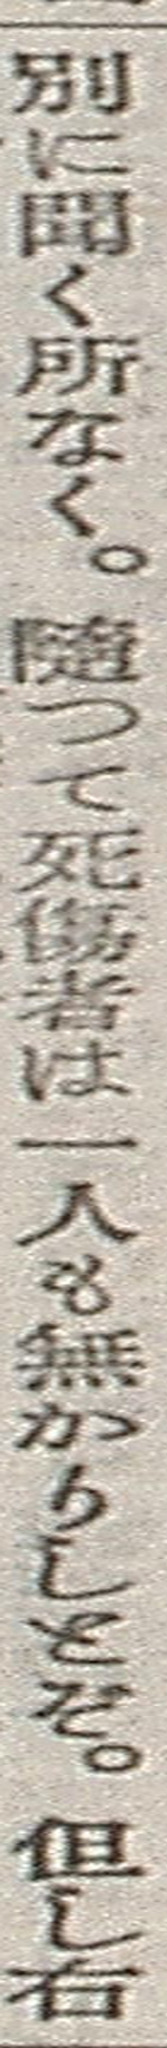別に聞く所なく。随つて死傷者は一人も無かりしとぞ。但し右
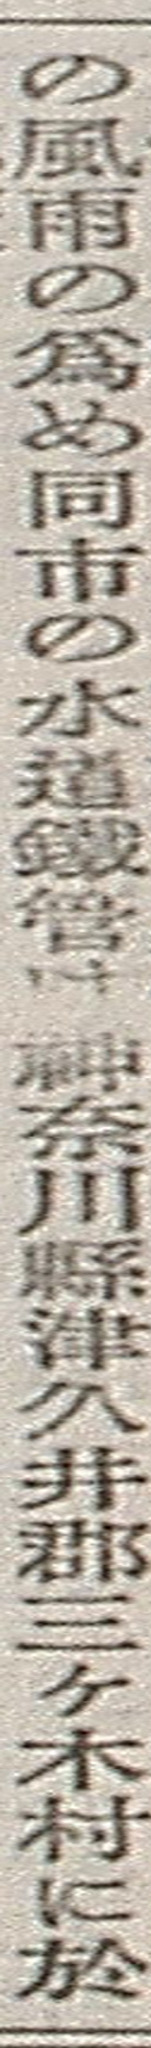の風雨の為め同市の水道鉄管は神奈川県津久井郡三ケ木村に於
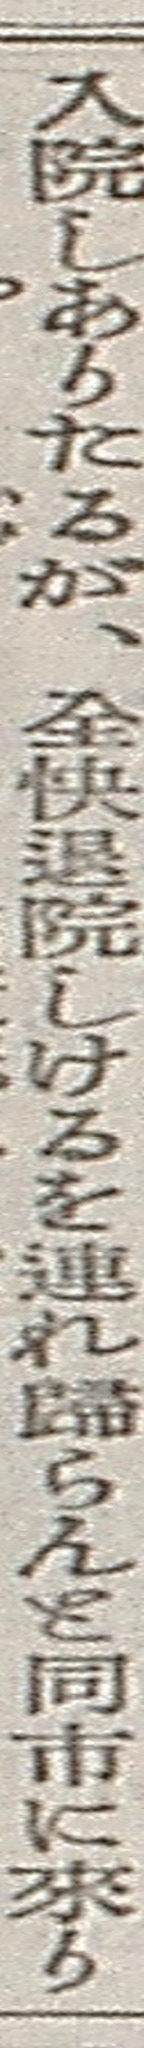入院しありたるが。全快退院しけるを連れ帰らんと同市に来り
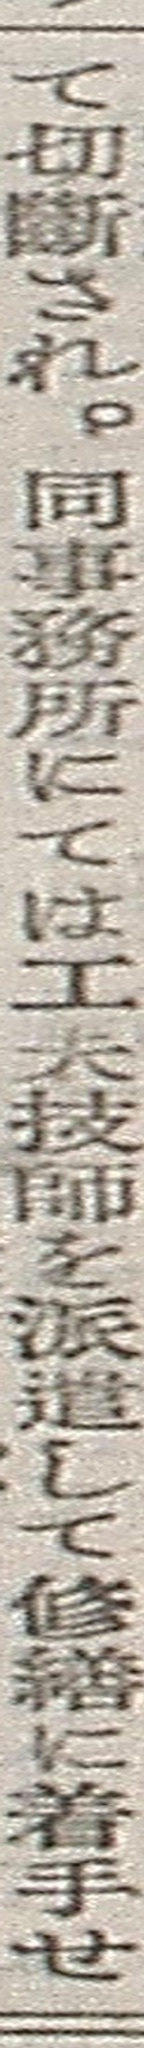て切断され。同事務所にては工夫技師を派遣して修繕に着手せ
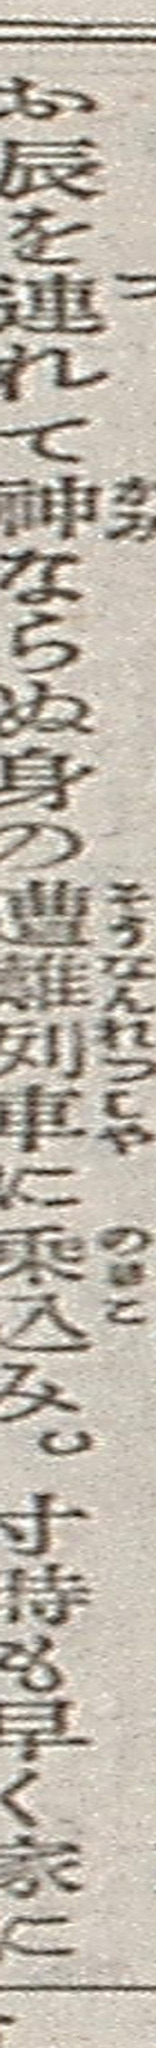お辰を連れて神ならぬ身の遭難列車に乗込み。寸時も早く家に
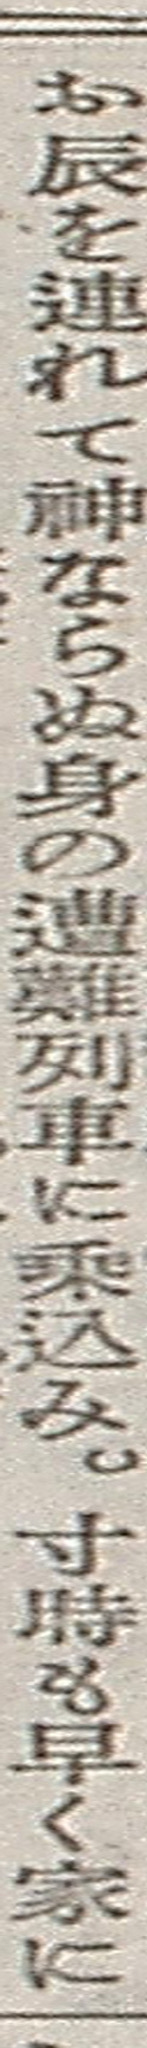お辰を連れて神ならぬ身の遭難列車に乗込み。寸時も早く家に
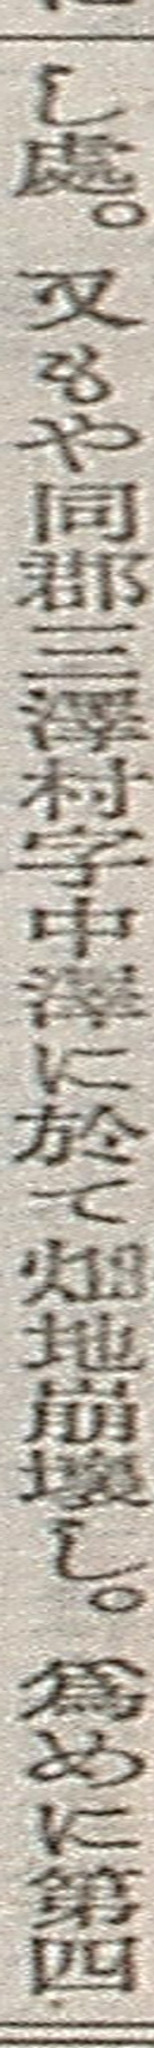し処。又もや同郡三沢村字中沢に於て畑地崩壊し。為めに第四
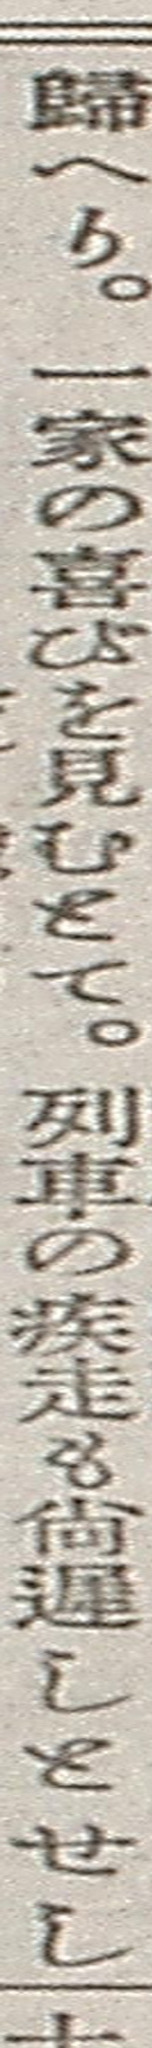帰へり。一家の喜びを見むとて。列車の疾走も尚遅しとせし
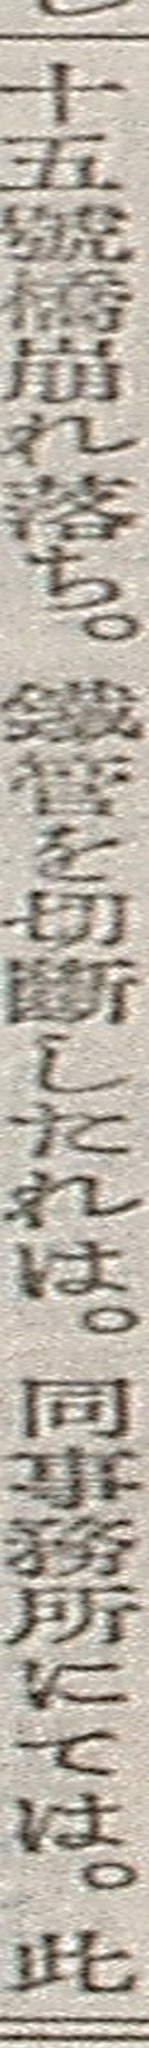十五号橋崩れ落ち。鉄管を切断したれは。同事務所にては。此
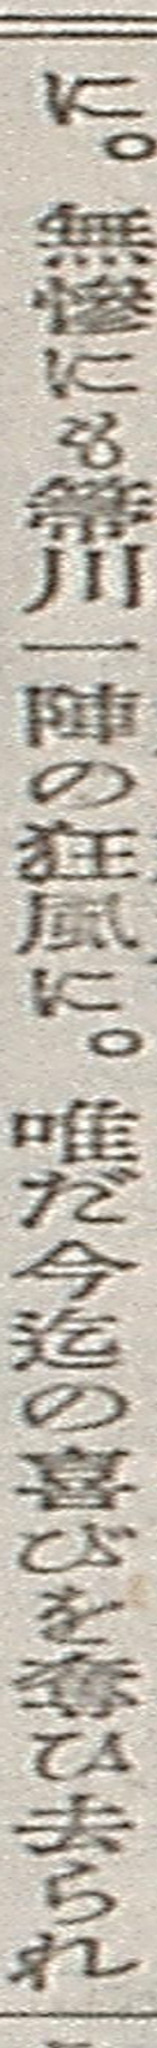に。無惨にも箒川一陣の狂風に。唯だ今迄の喜びを奪ひ去られ
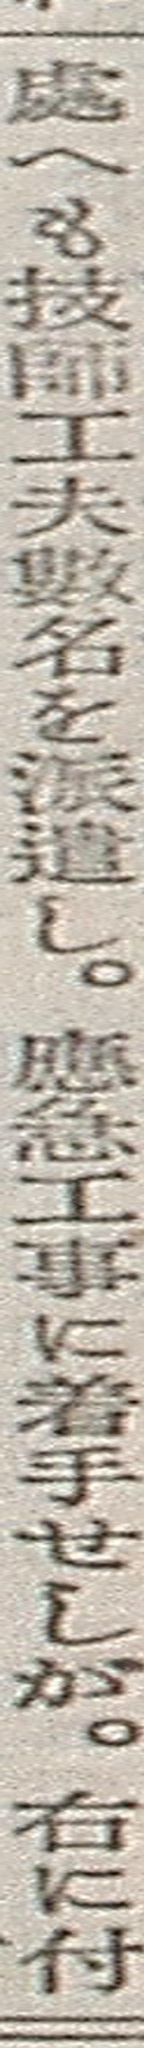処へも技師工夫数名を派遣し。応急工事に着手せしが。右に付
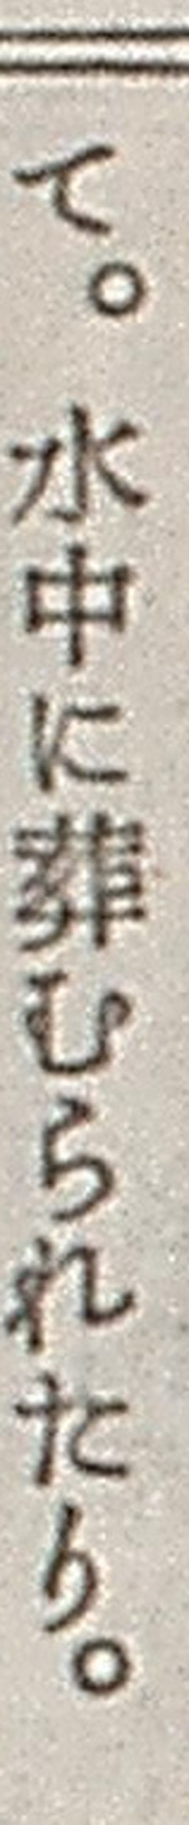て。水中に葬むられたり。
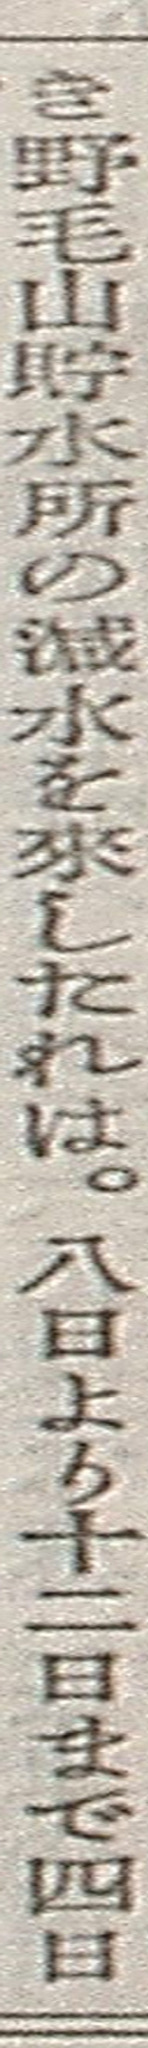き野毛山貯水所の減水を来したれは。八日より十二日まで四日
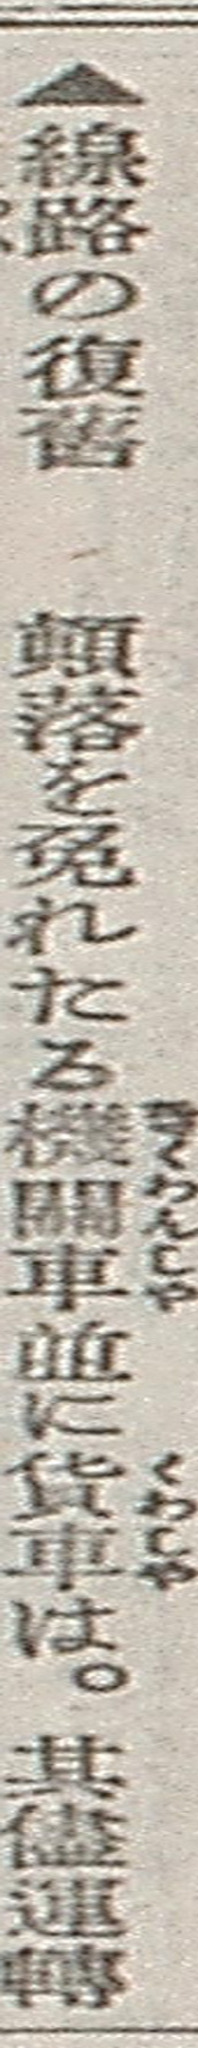▲線路の復旧顛落を免れたる機関車並に貨車は。其侭運転
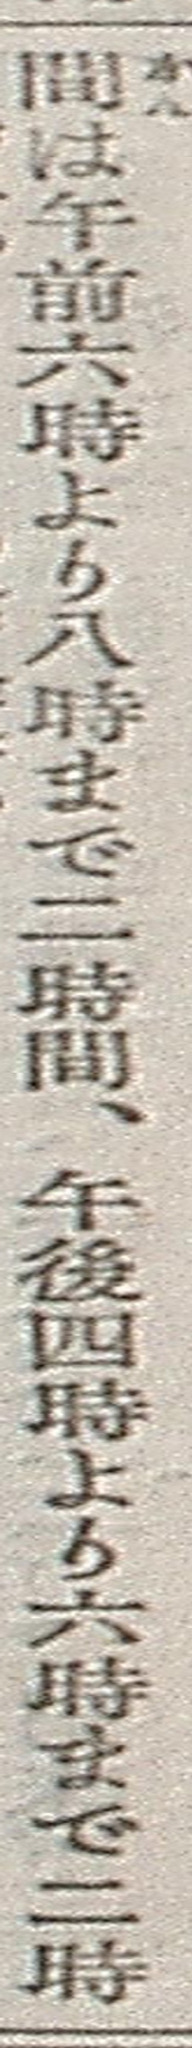間は午前六時より八時まで二時間、午後四時より六時まで二時
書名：風俗畫報臨時増刊第百九十九號　明治三十二年十月各地災害圖會（前編之續）
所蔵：東京大学地震研究所図書室 Earthquake Research Institute Library, The University of Tokyo, JAPAN
